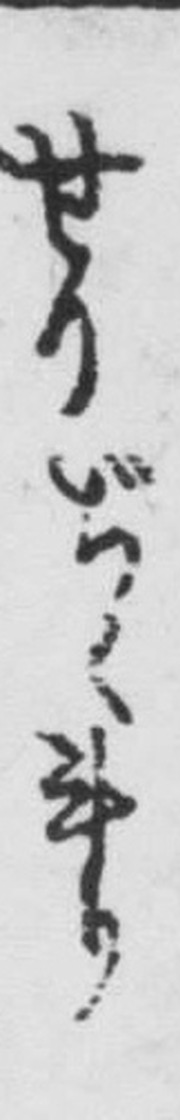せりぢく斗り
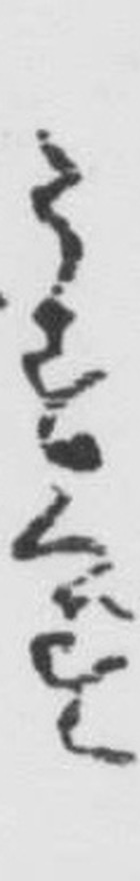うすくず
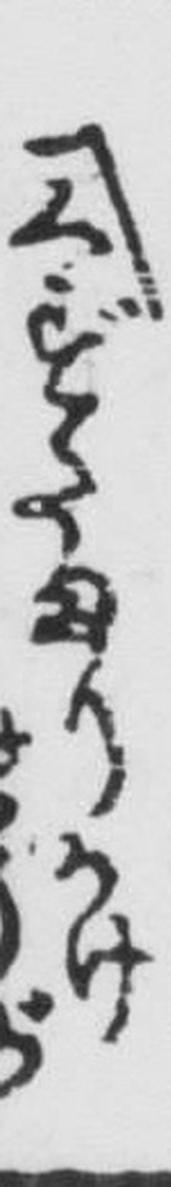〽くずたまりかけ
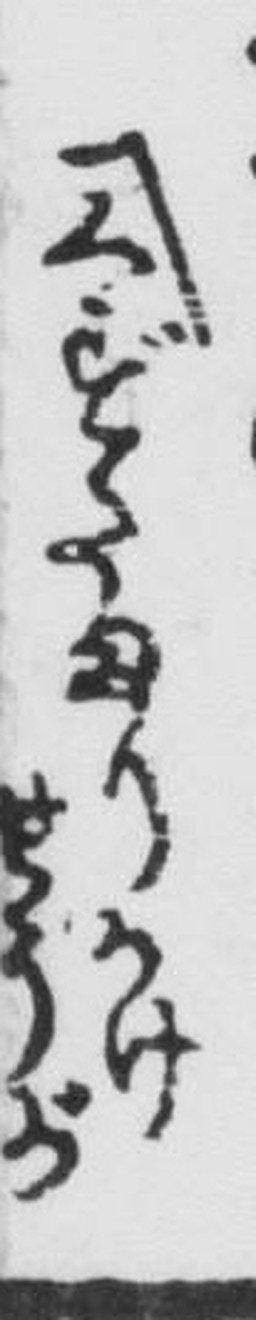〽くずたまりかけ
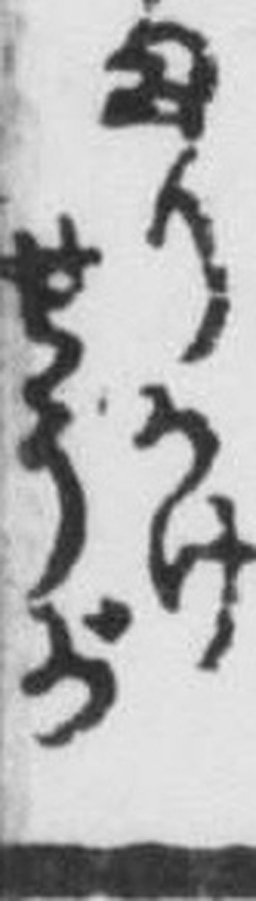せうが
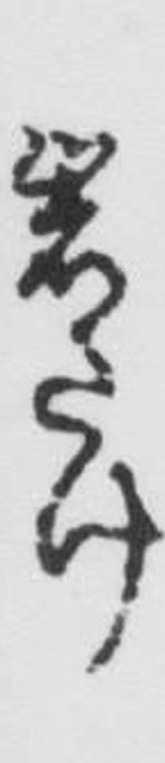岩たけ
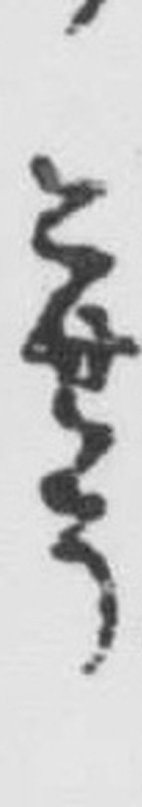こせう
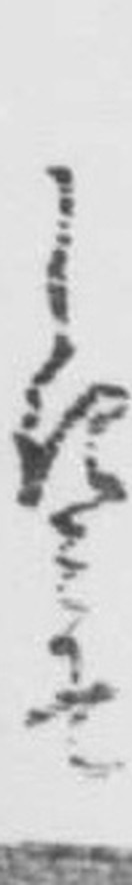しきみそ
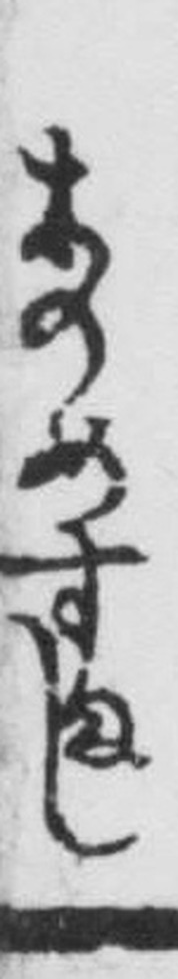木のめすまし

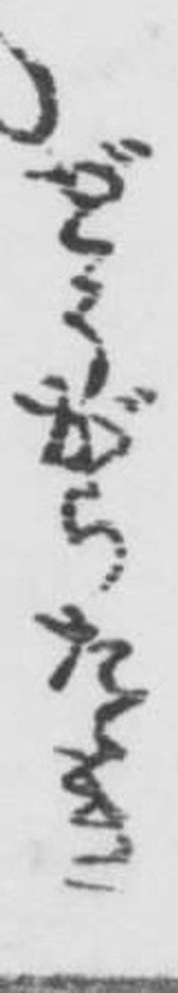かもどうがらたゝき
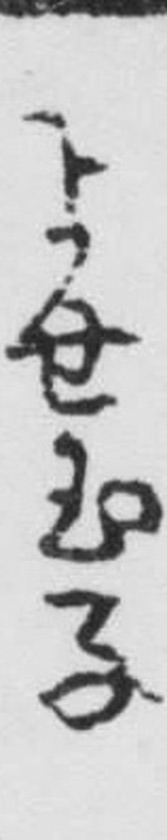よせ玉子
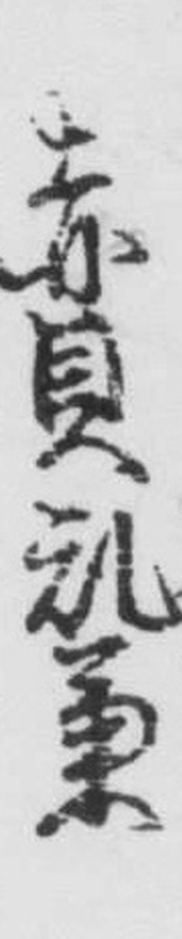赤貝乱菊
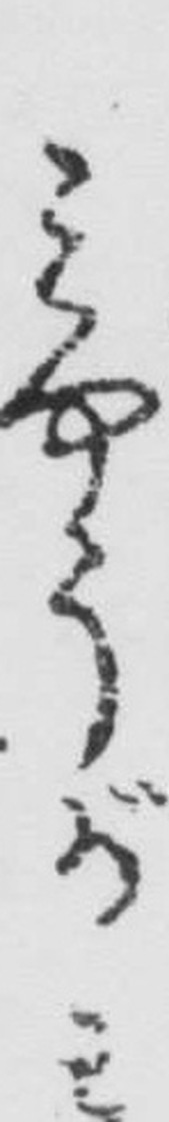みやうが
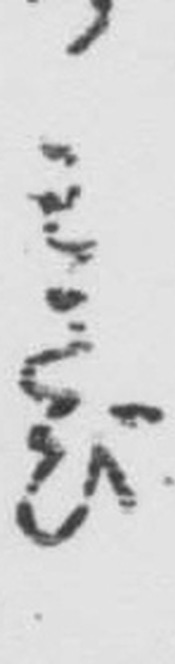わさび
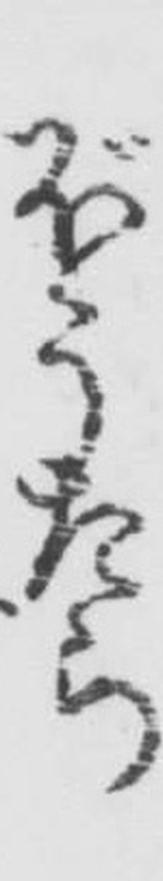ぼうたら
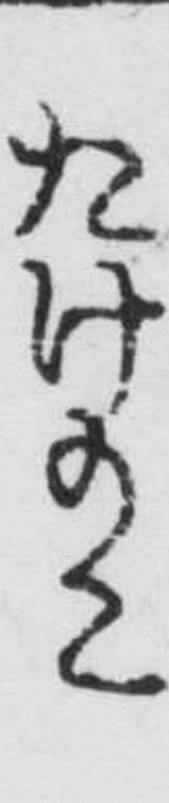たけのこ
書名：諸家通用/即席料理
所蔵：大阪府立大学学術情報センター 国文学研究資料館
